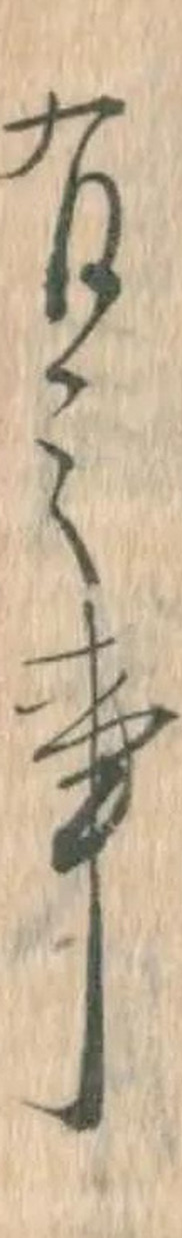有之事
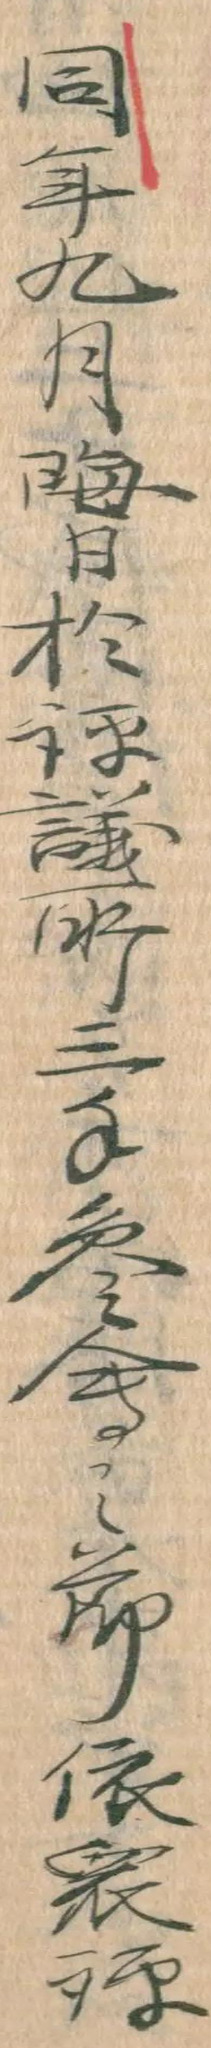同年九月晦日於評議所三手参會之節依衆評
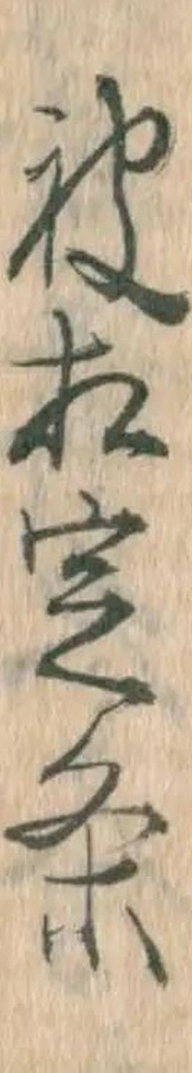被相定条
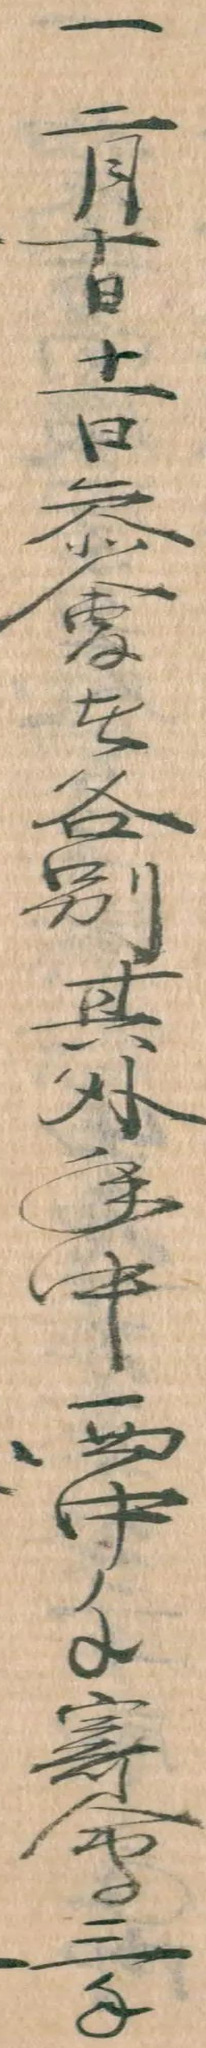一二月十日十一日参會者各別其外手中西中手寄會三手
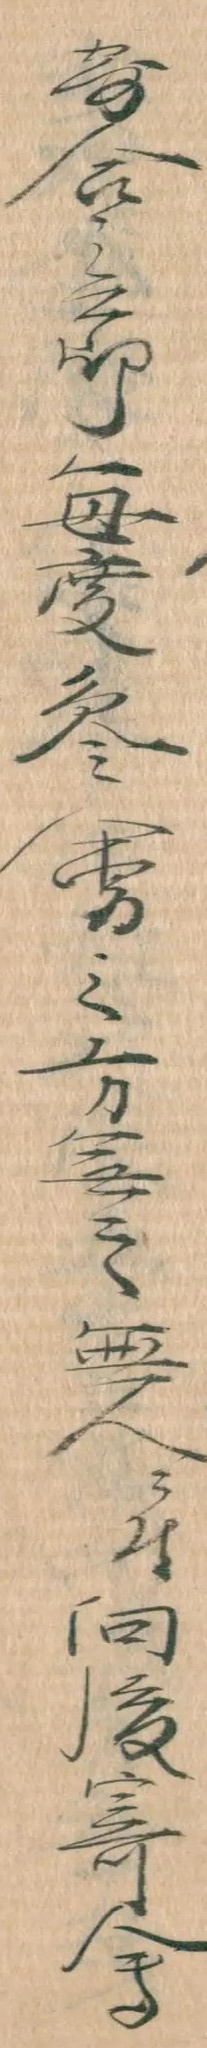寄合之節毎度参會之方無之無人ニ付向後寄會
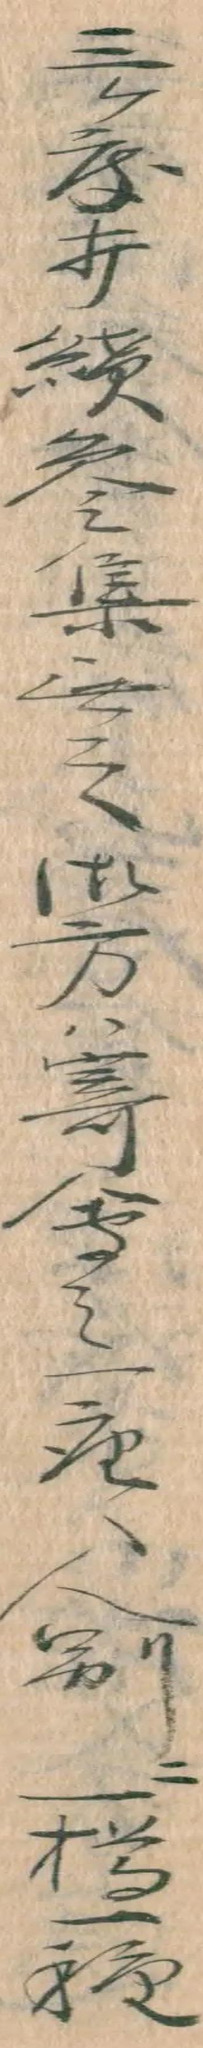三ケ度打續参集無之御方ハ寄會之一座へ人別ニ一樽一種
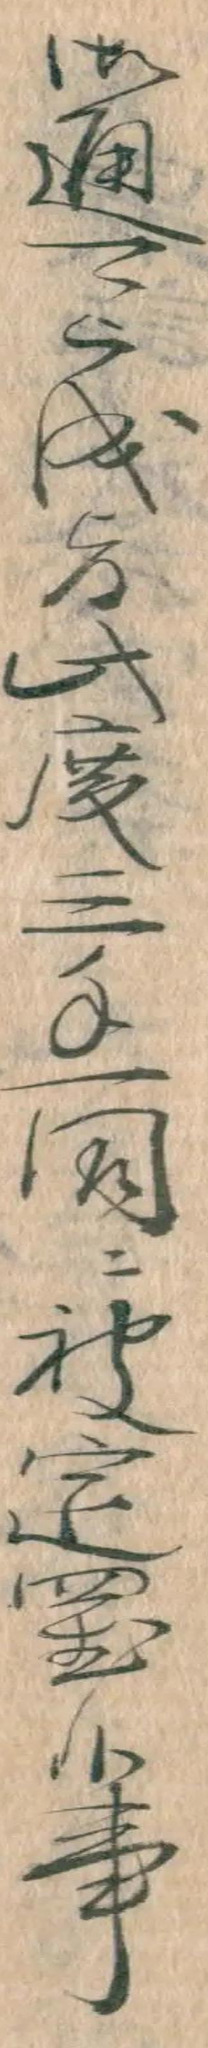御通可被成旨此度三手一同ニ被定置候事
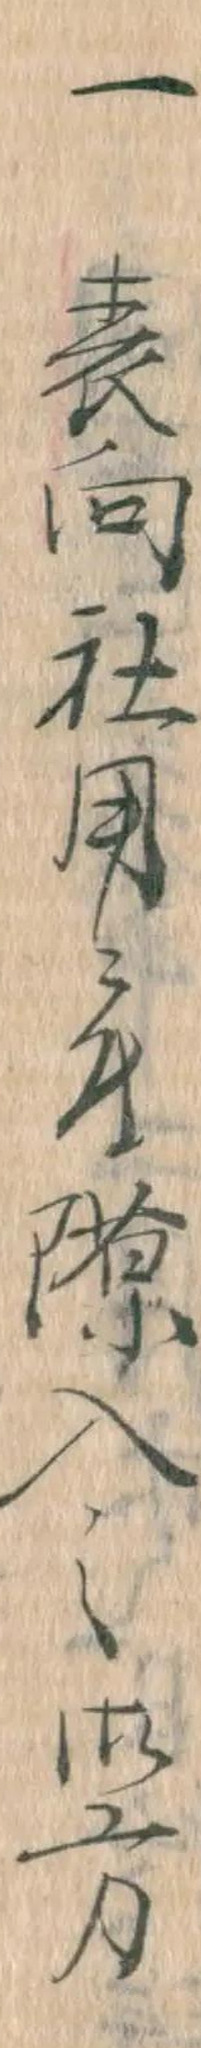一表向社用ニ付隙入之御方
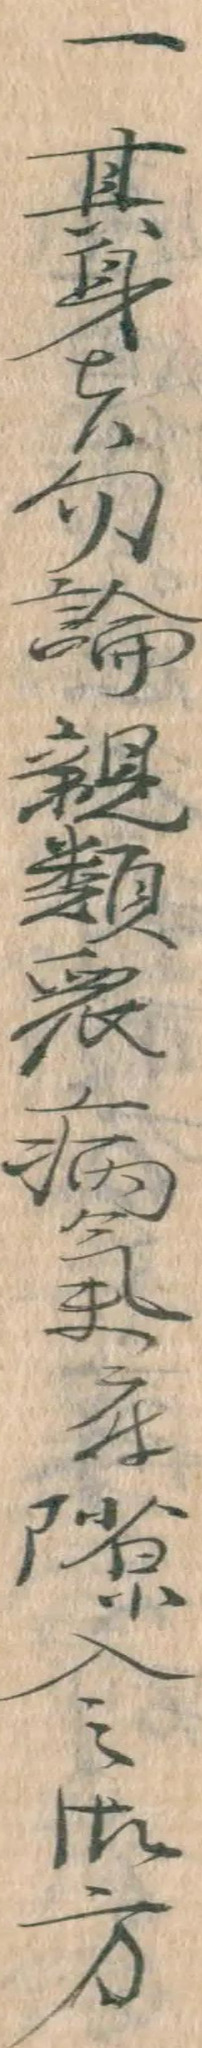一其身者勿論親類震病氣ニ付隙小入之御方
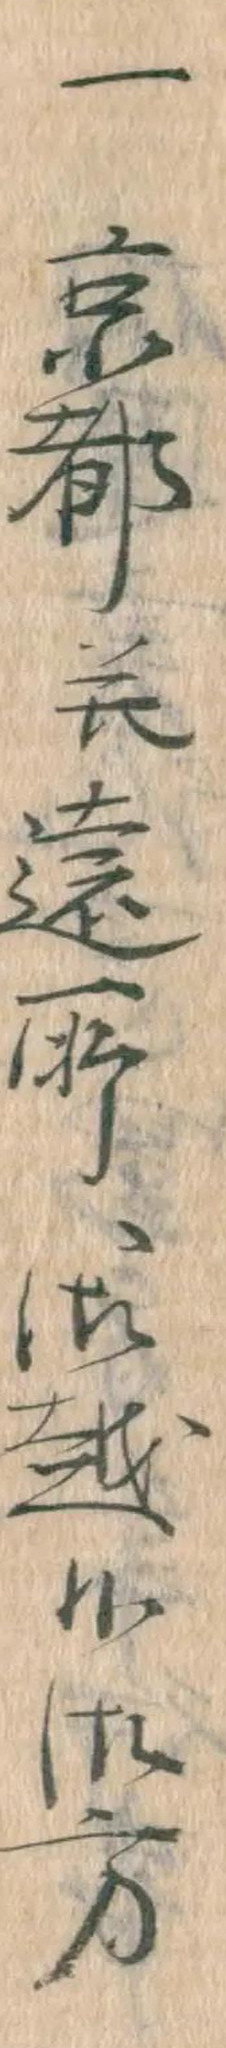一京都并遠所へ御越候御方
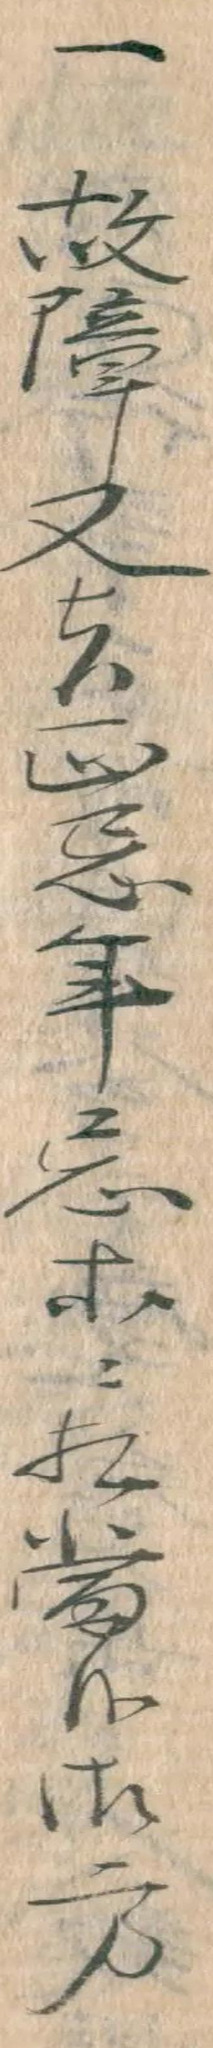一故障又者正忌年忌等ニ相當候御方
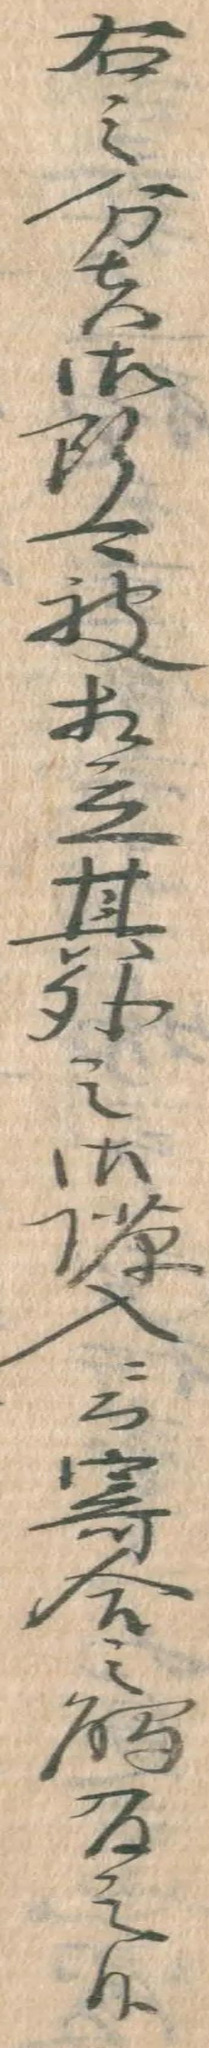右之分は御断可被相立其外之御隙入ニ而寄合之觸有之候
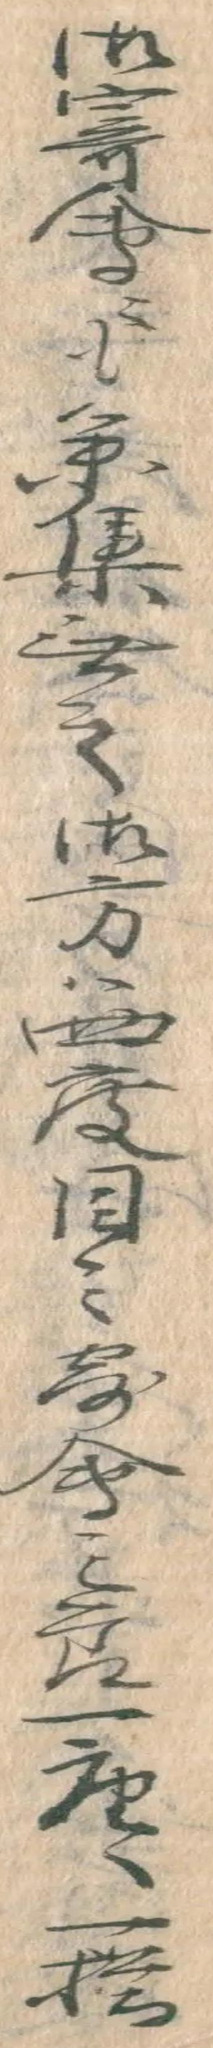御寄會ニも参集無之御方ハ四度目之寄會之節一座へ一樽
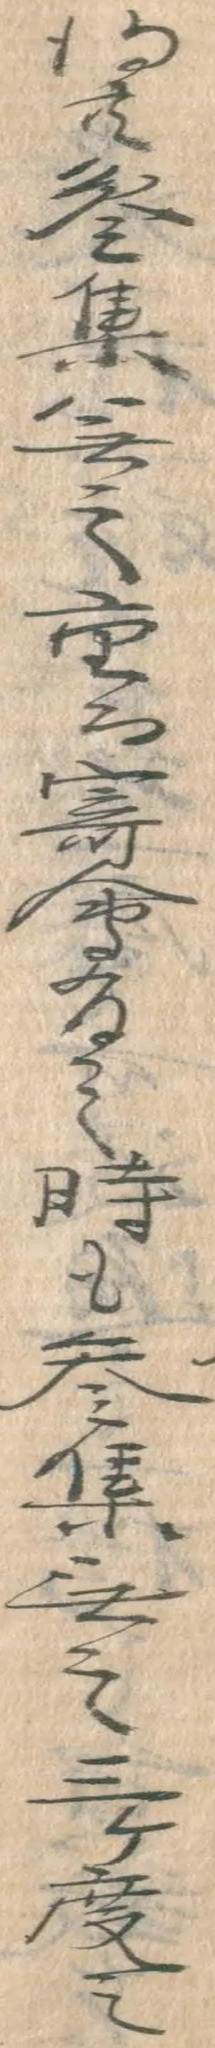得共参集無之重而寄會有之時も参集無之三ケ度之
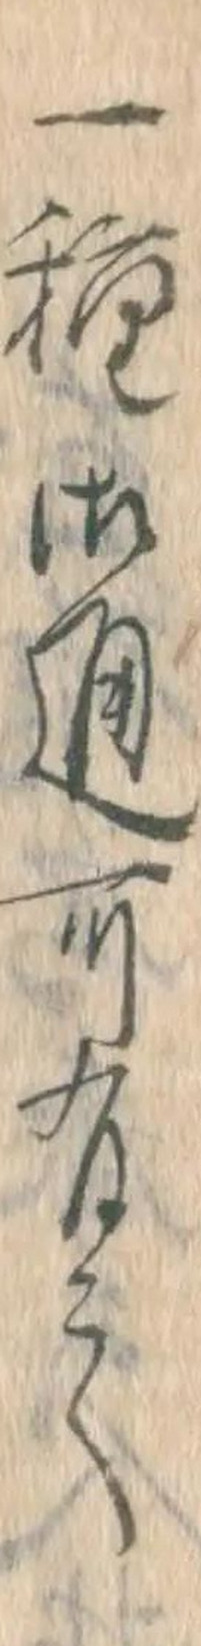一種御通可有之
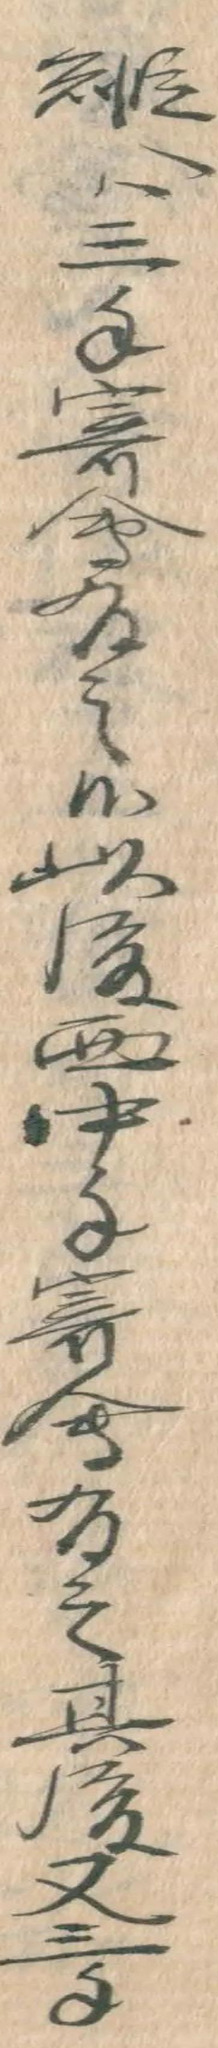縦へハ三手寄會有之候以後西中手寄會有之其後又三手
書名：賀茂社記録. 第29冊
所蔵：国立国会図書館 National Diet Library, JAPAN
